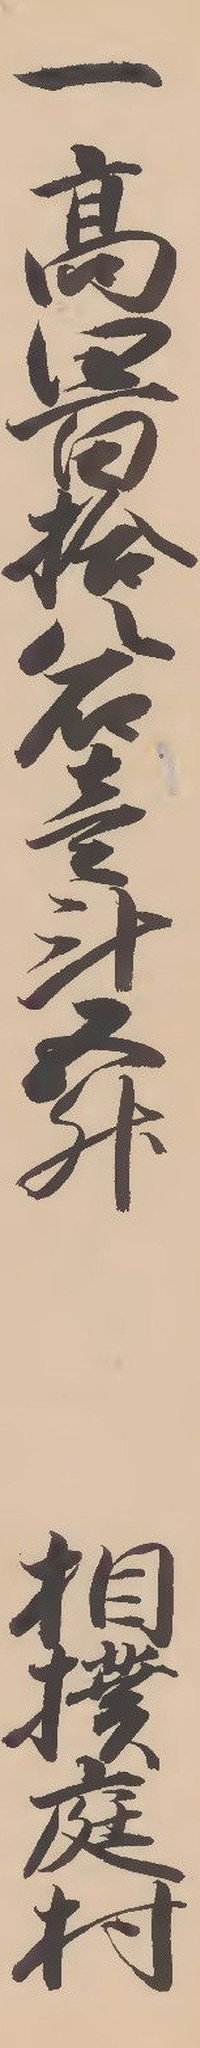一高四百拾八石壱斗五升相撲庭村
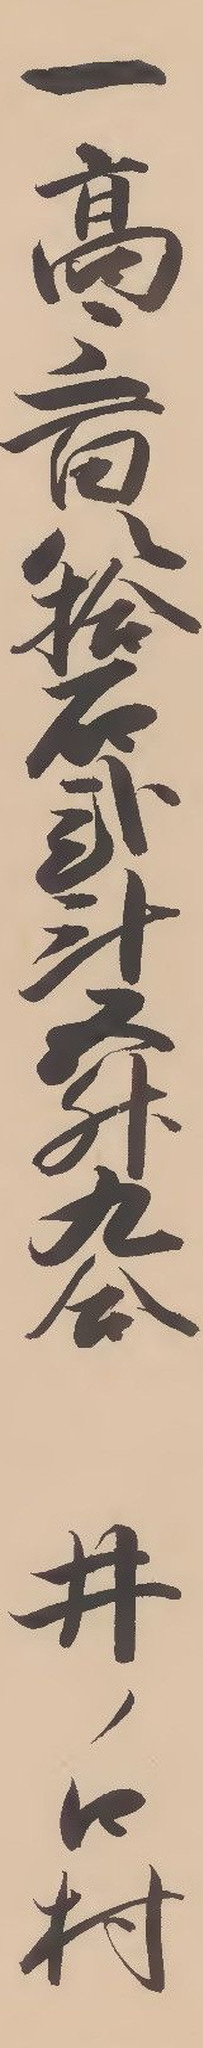一高三百八拾石弐斗五升九合井ノ口村
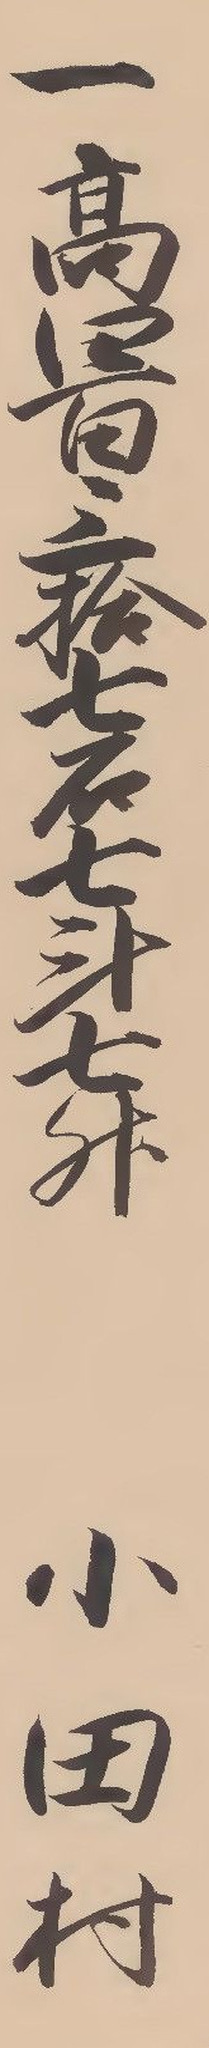一高四百三拾七石七斗七升小田村
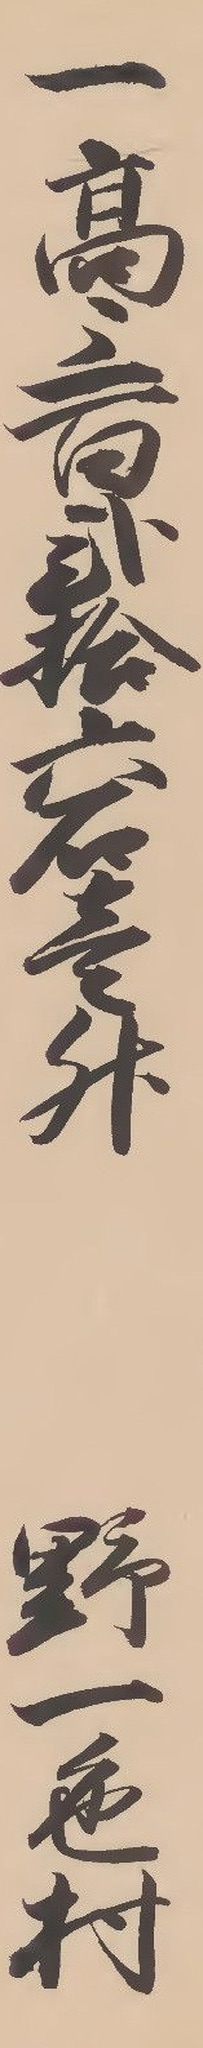一高三百弐拾六石壱升野一色村
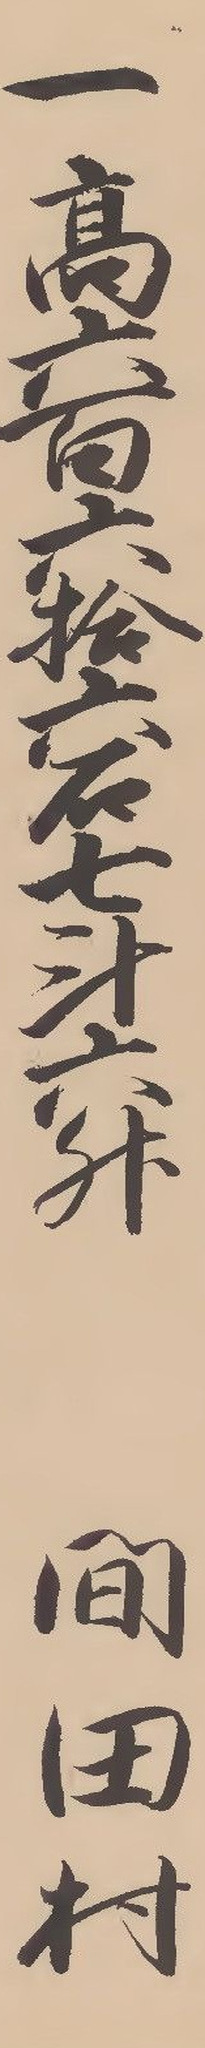一高六百六拾六石七斗六升間田村
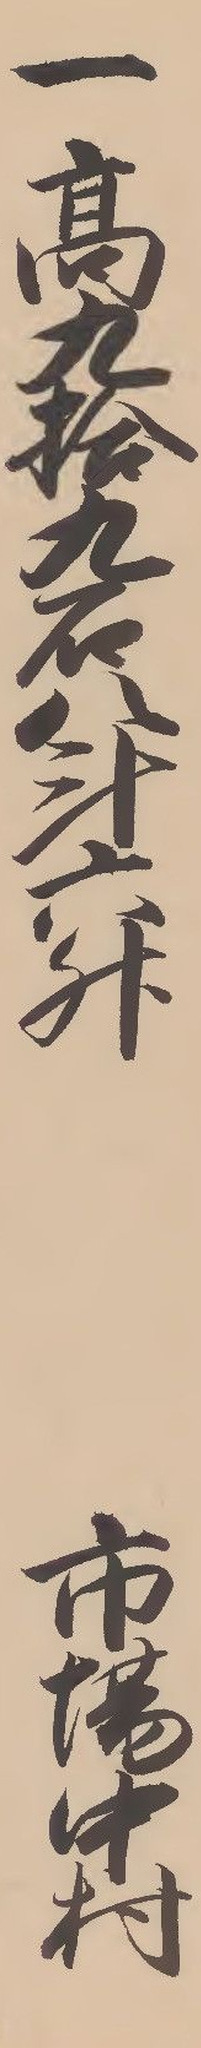一高九拾九石八斗六升市場中村
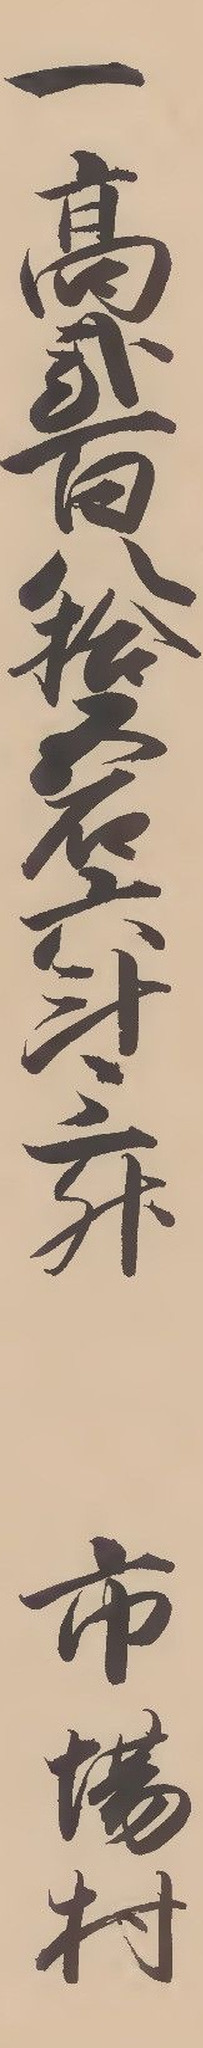一高弐百八拾五石六斗三升市場村
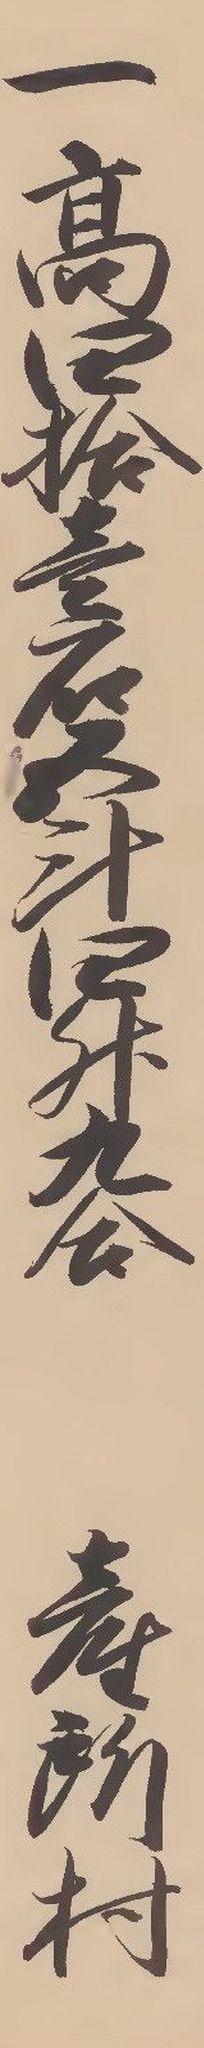一高四拾壱石五斗四升九合産所村

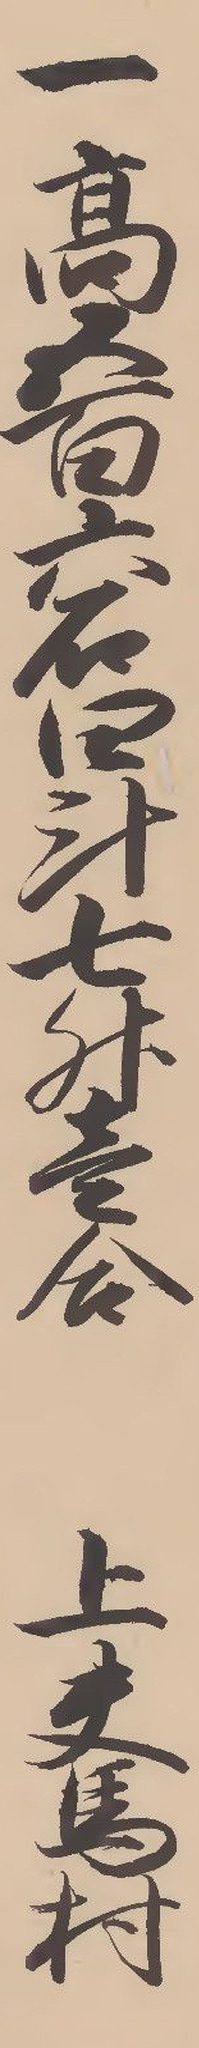一高五百六石四斗七升壱合上夫馬村
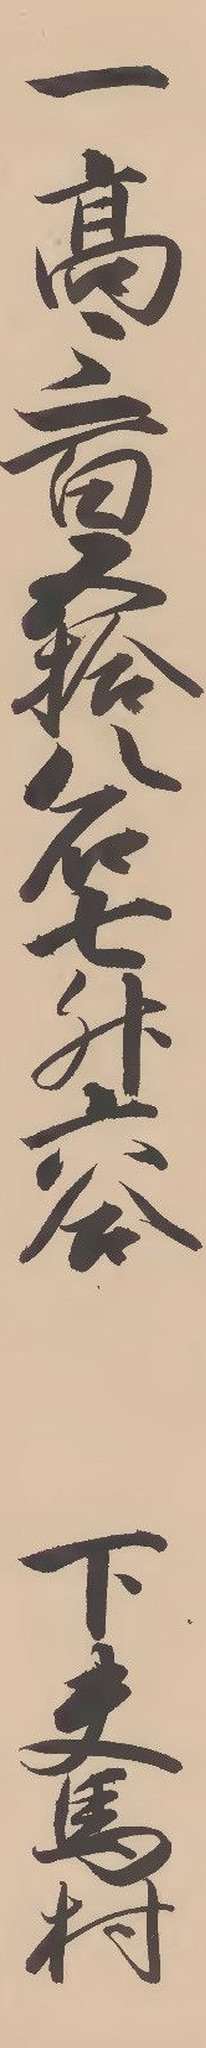一高三百五拾八石七升六合下夫馬村
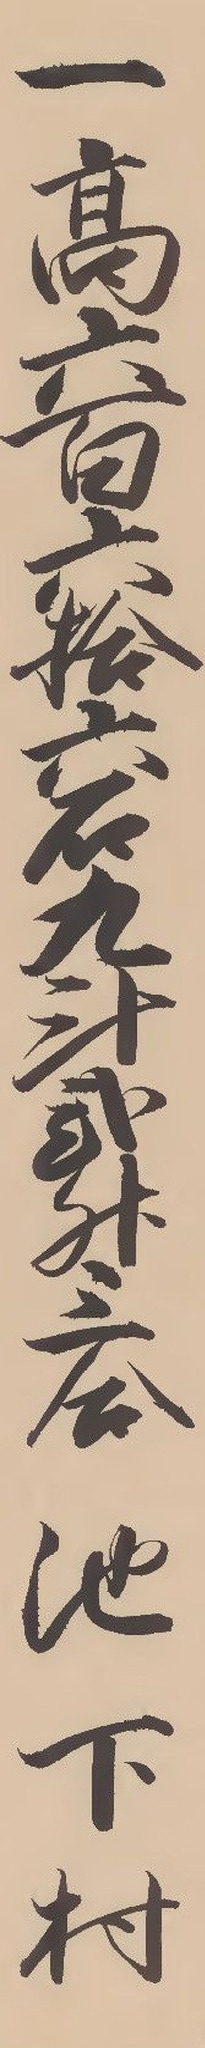一高六百六拾六石九斗弐升三合池下村
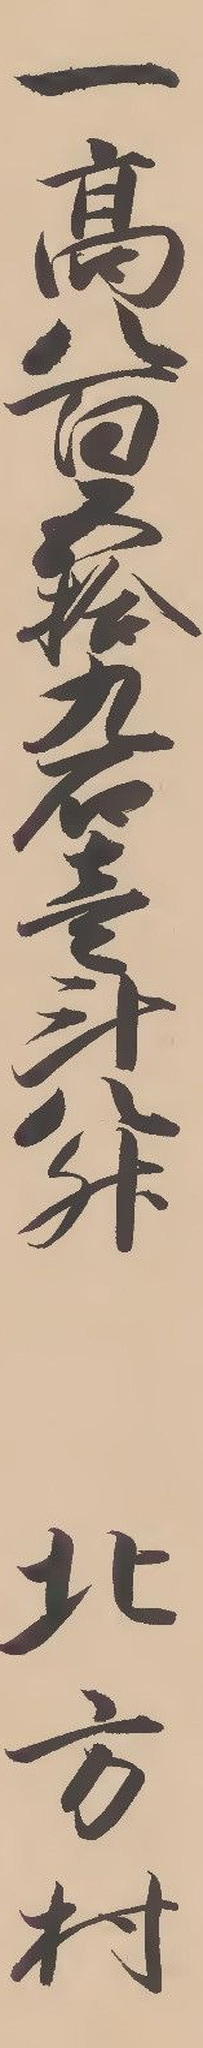一高八百五拾九石壱斗八升北方村
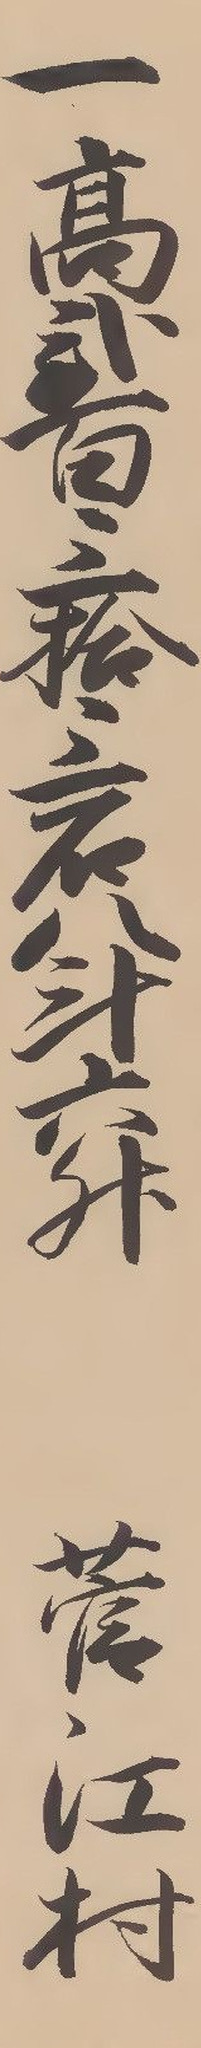一高弐百三拾三石八斗六升菅江村
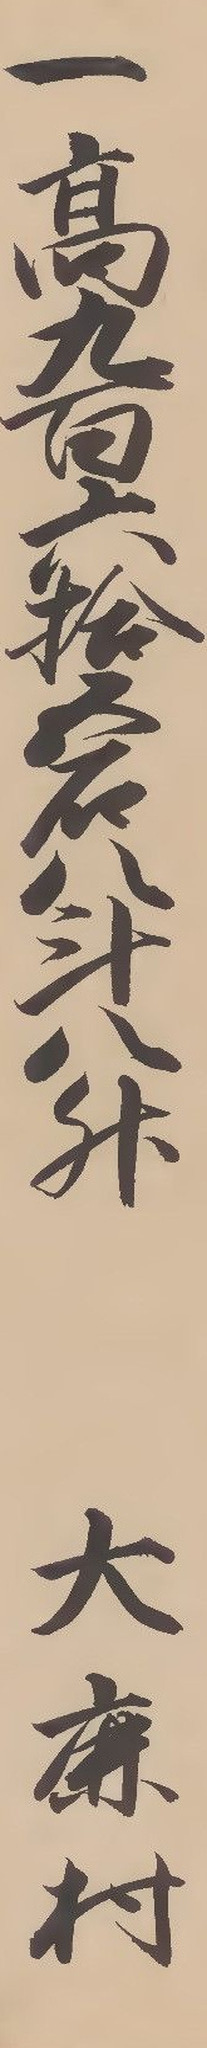一高九百六拾五石八斗八升大鹿村
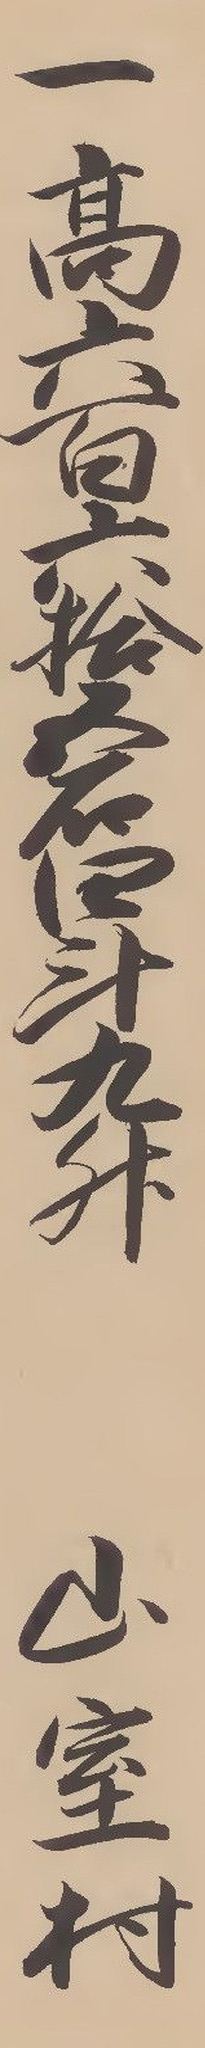一高六百六拾五石四斗九升山室村
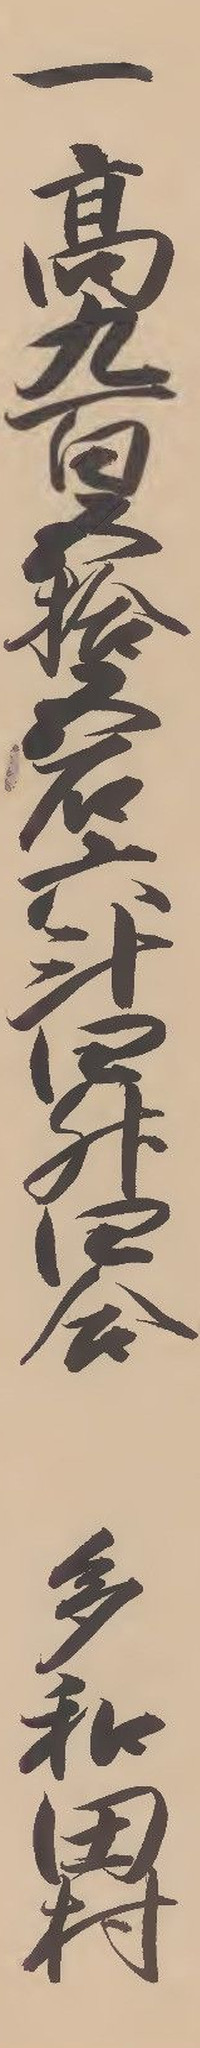一高九百五拾五石六斗四升四合多和田村
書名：近江国郷帳
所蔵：国立公文書館 National Archives of Japan
